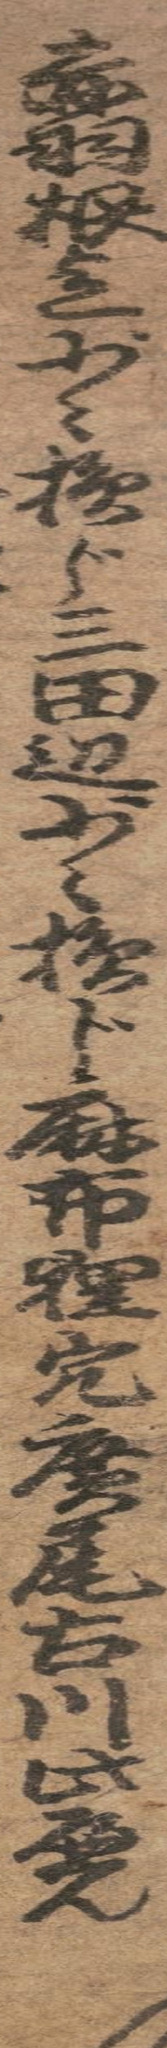赤羽根迄少々損じ三田辺少々損じ麻布狸穴広尾古川此へん
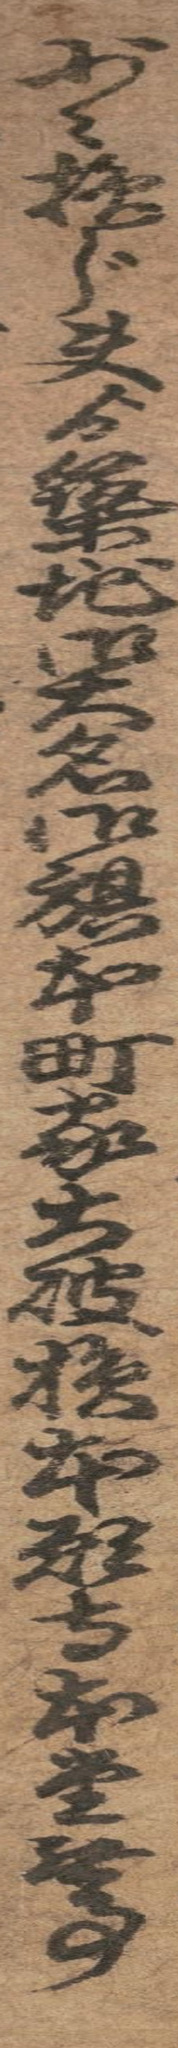少々損じ夫ゟ築地御大名御旗本町家大破損本願寺本堂無事
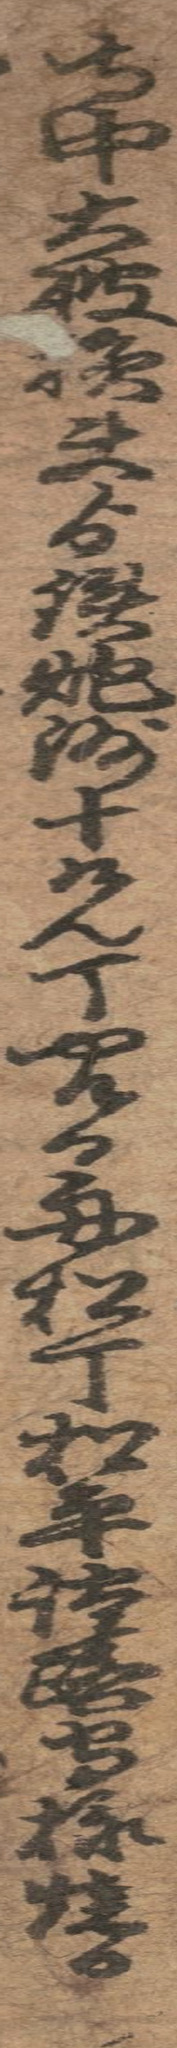寺中大破損夫ゟ鉄炮洲十けん丁やける船松丁松平淡路守様焼る
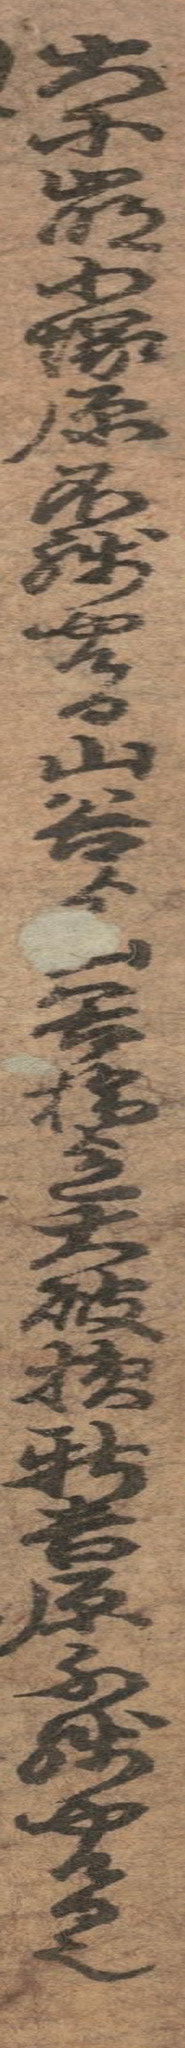大に崩小塚原不残やける山谷ゟ山谷橋迄大破損新吉原不残やける也
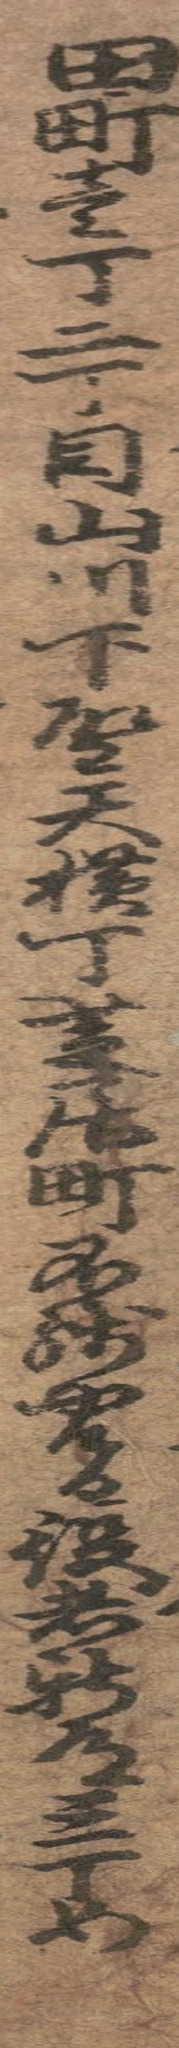田町壱丁二丁目山川下聖天横丁芝居町不残やける役者新道三丁め
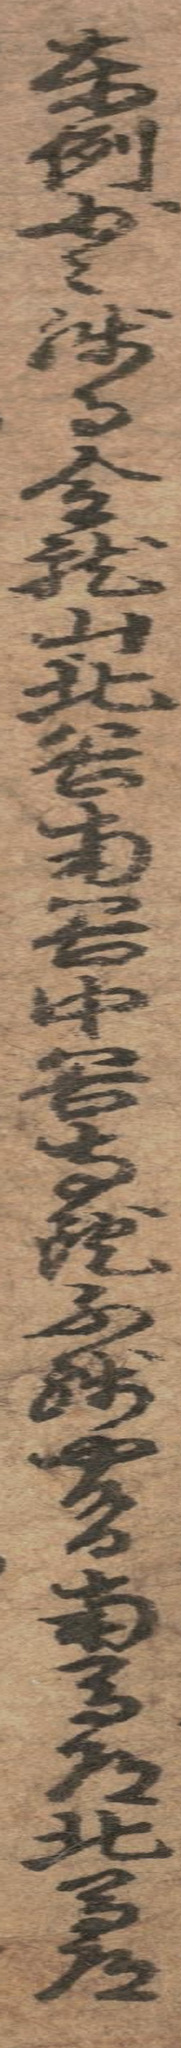東側少々残る金龍山北谷南谷中谷寺院不残やける南馬道北馬道
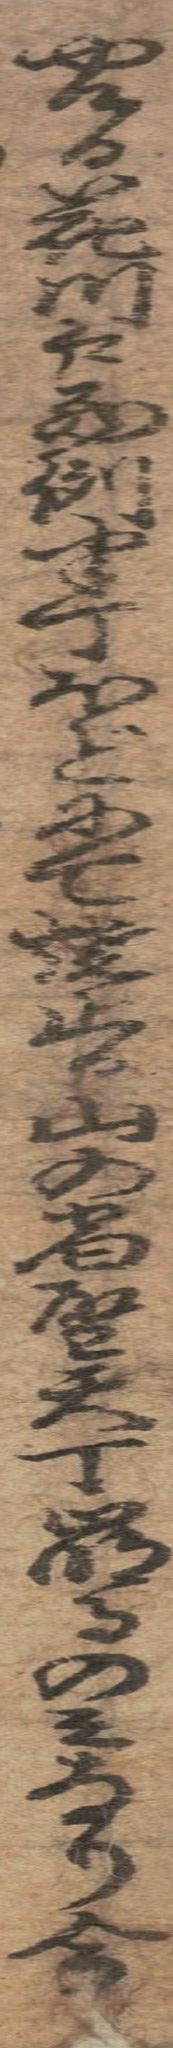やける花川戸西側半丁ほどにて焼止る山の宿聖天丁崩るのミなり今
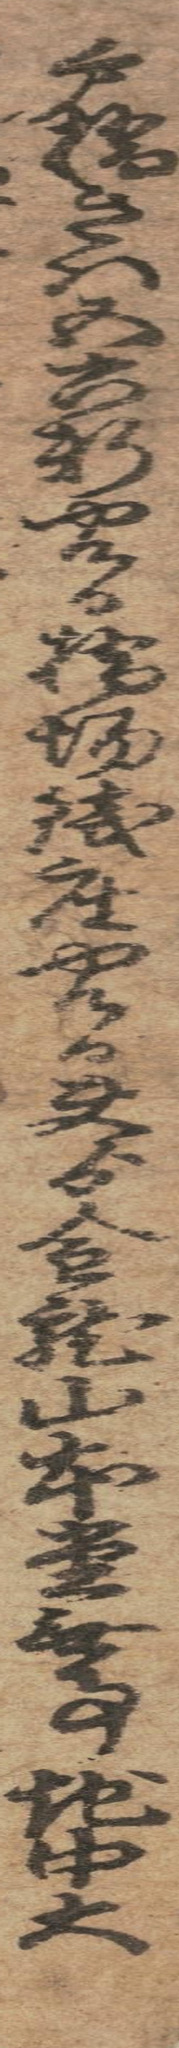戸橋きハ五六軒やける橋場銭座やける夫ゟ金龍山本堂無事地中大
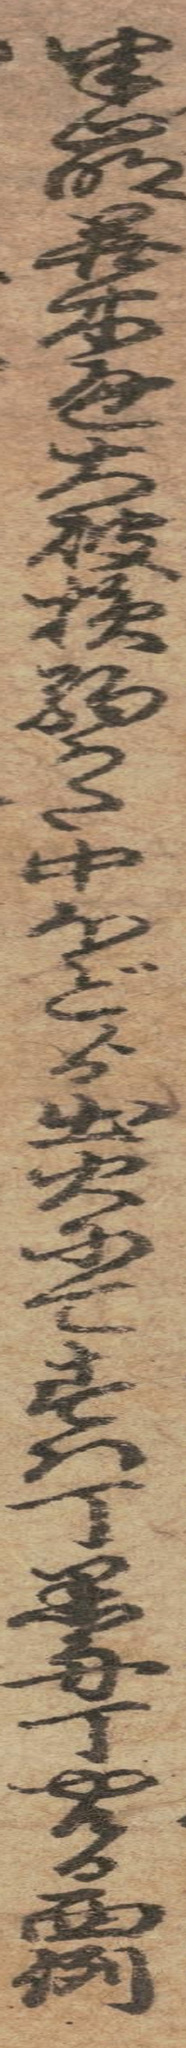半崩並木通大破損駒かた中ほどゟ出火にてすハ丁黒舟丁やける西側
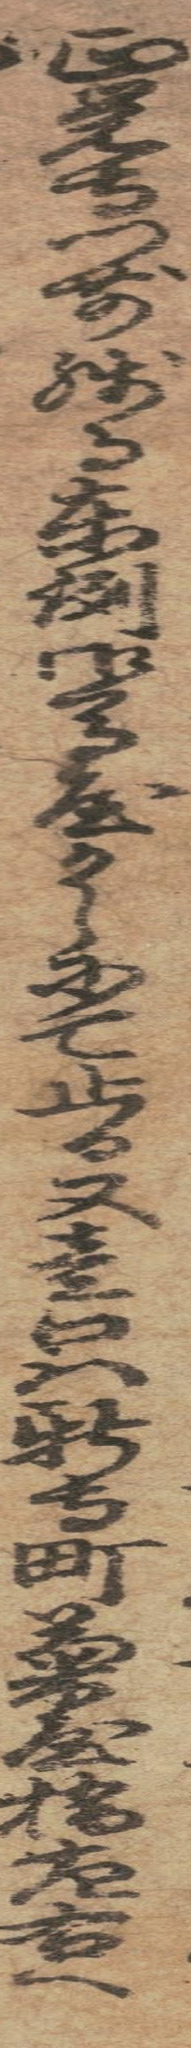正覚寺門前残る東側御馬屋かしにて止る又壱口ハ新寺町菊屋橋左右へ
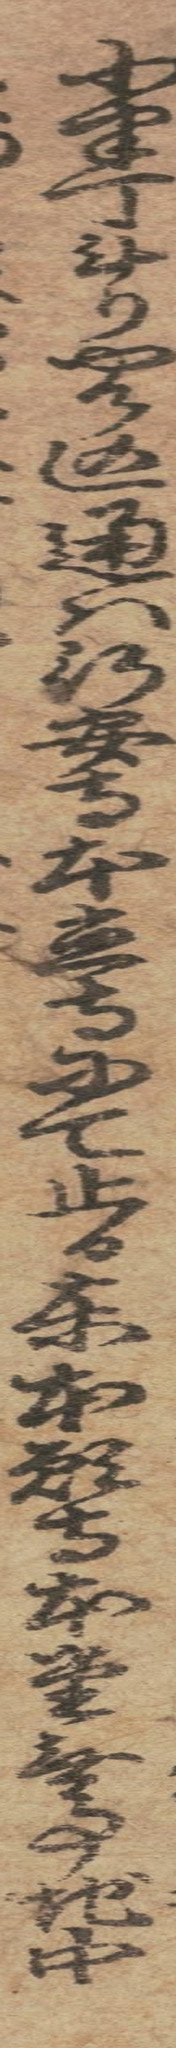小半丁斗りやけ込通ハ行安寺本恵寺にて止る東本願寺本堂無事地中
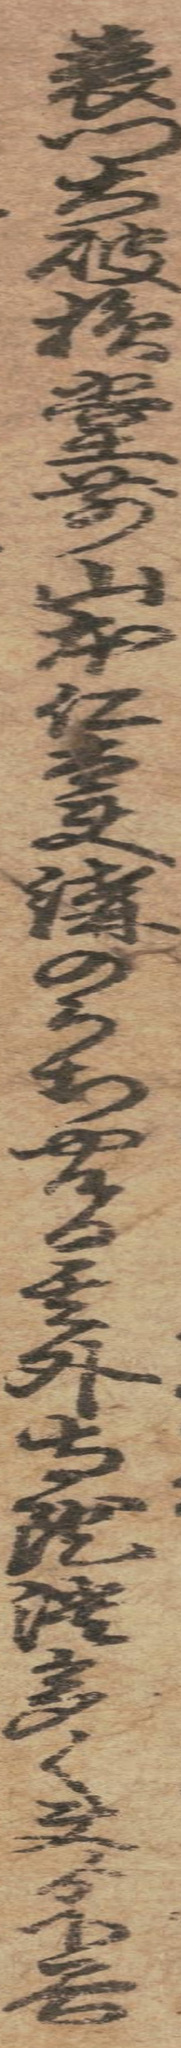表門大破損堂前山本仁太夫構のうちやける其外地蔵院潰多く夫ゟ下谷
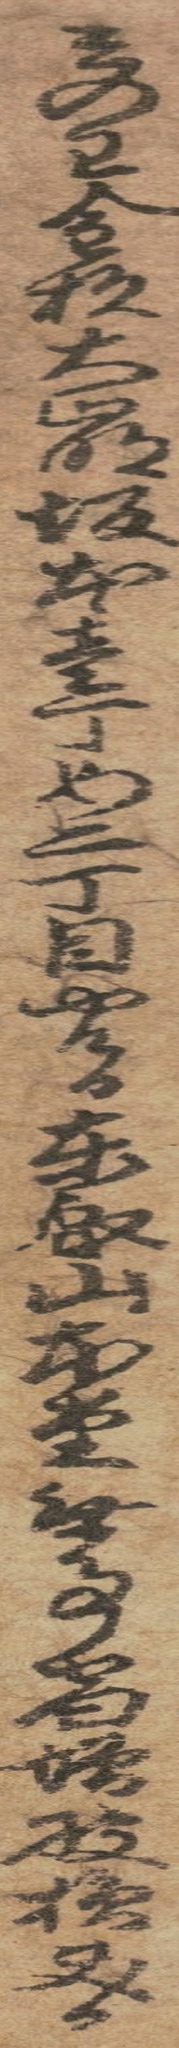ミのわ金杉大崩坂本壱丁め二丁目やける東叡山本堂無事宿坊破損夫ゟ
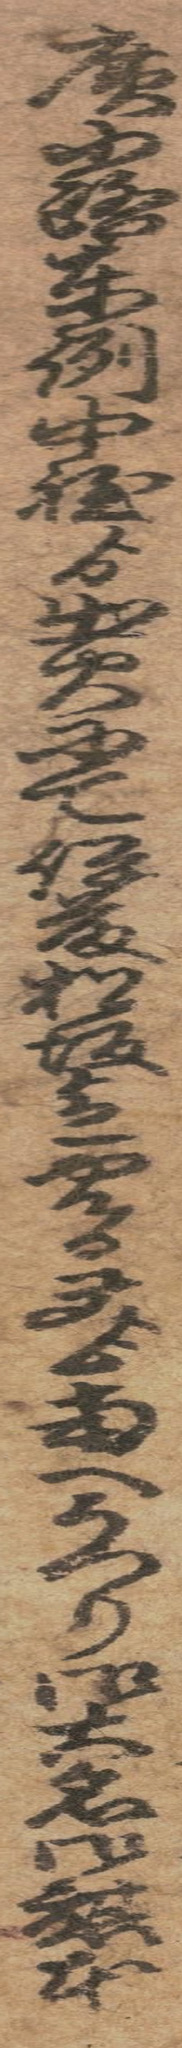広小路東側中程ゟ出火にて伊藤松坂迄やける夫ゟ南へうつり御大名御旗本
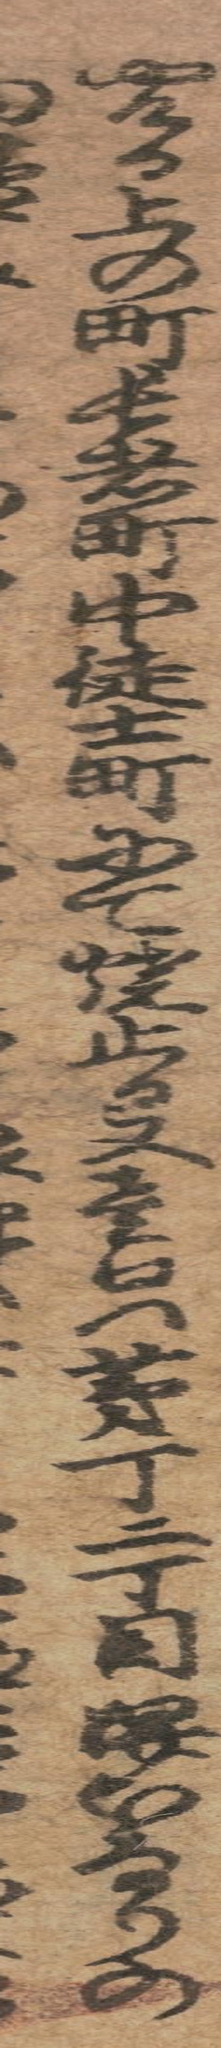やける上の町長者町中徒士町にて焼止る又壱口ハ茅丁二丁目堺いなりの
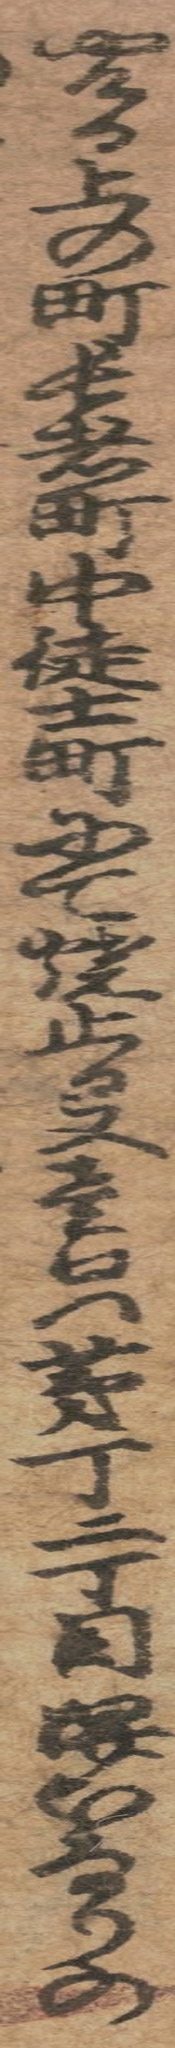やける上の町長者町中徒士町にて焼止る又壱口ハ茅丁二丁目堺いなりの
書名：[安政江戸地震に関する瓦版]
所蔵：東京大学地震研究所図書室 Earthquake Research Institute Library, The University of Tokyo, JAPAN
